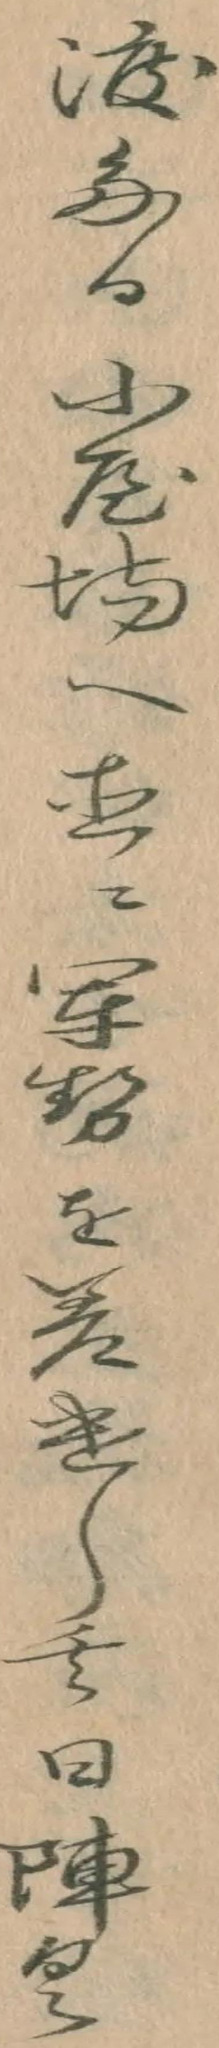渡多る小屋場へ直に軍勢を差遣し其日陣具
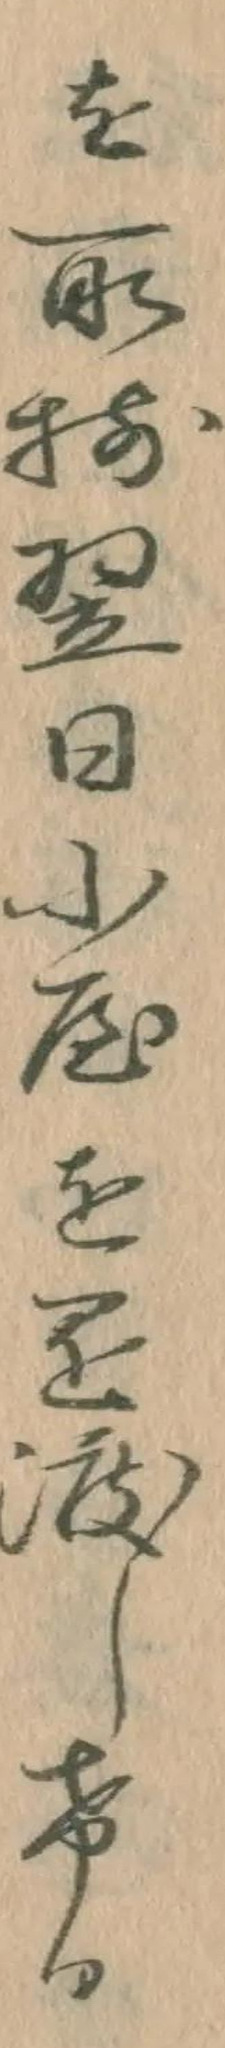を取揃翌日小屋を懸渡し希る
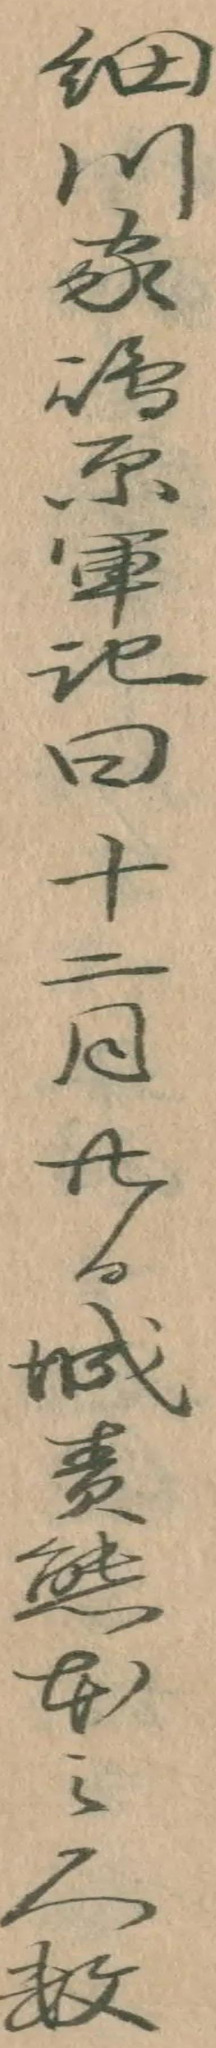細川家島原軍記曰十二月廿日城責熊本之人数
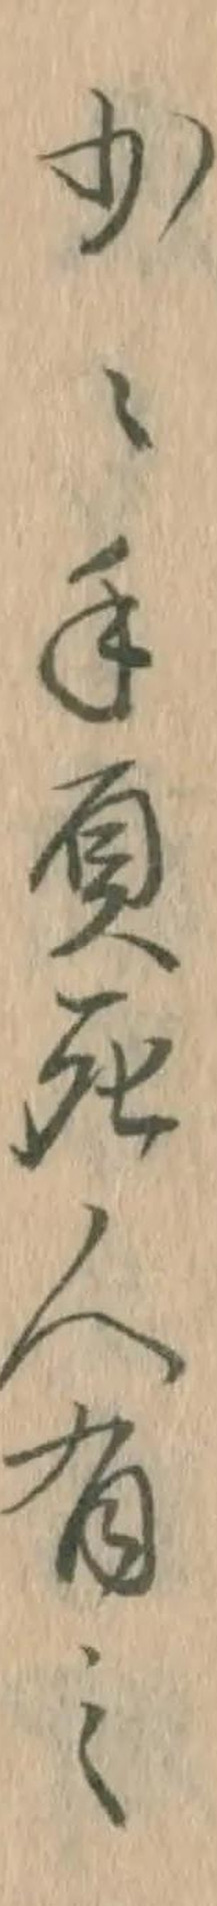少々手負死人有之
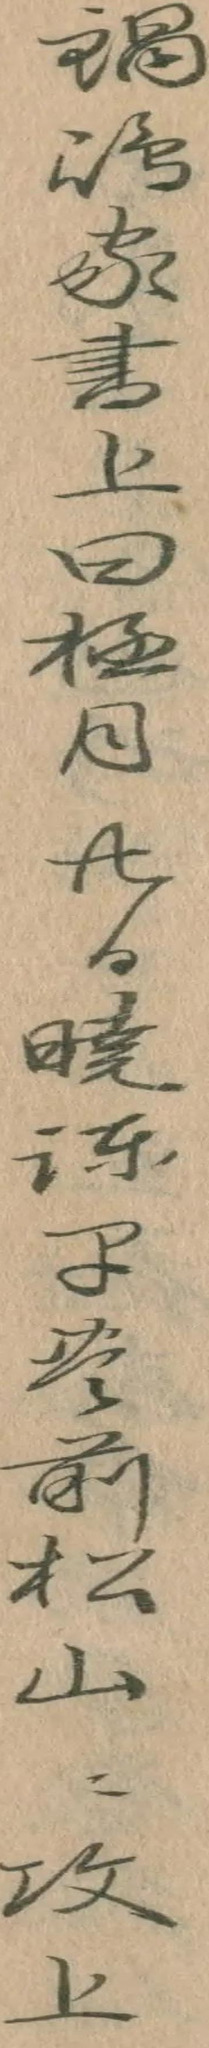鍋島家書上曰極月廿日暁諌早豊前松山に攻上
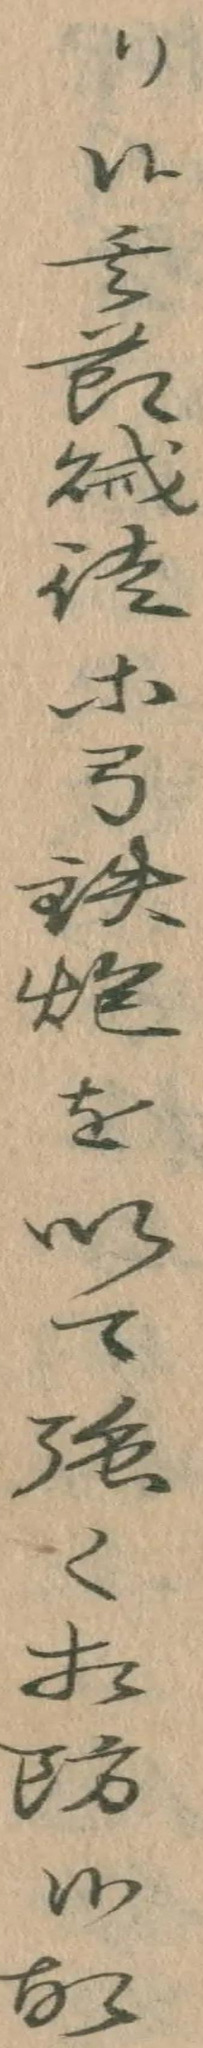り候其節賊徒等弓鉄炮を以て強く相防候故
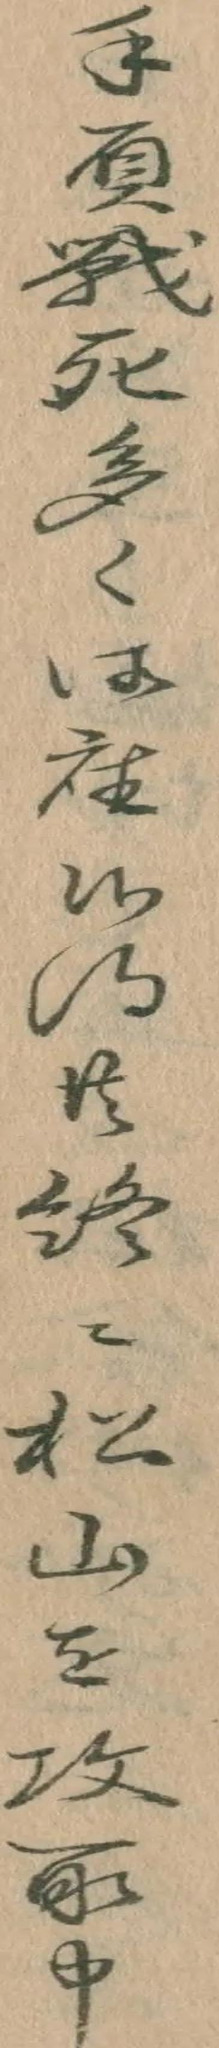手負戦死多く御座候得共終に松山を攻取申
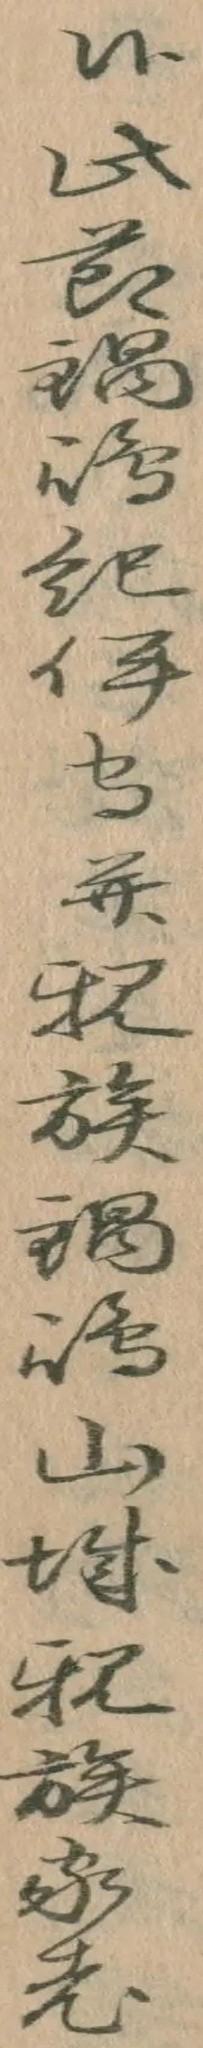候此節鍋島紀伊守幷親族鍋島山城親族家老
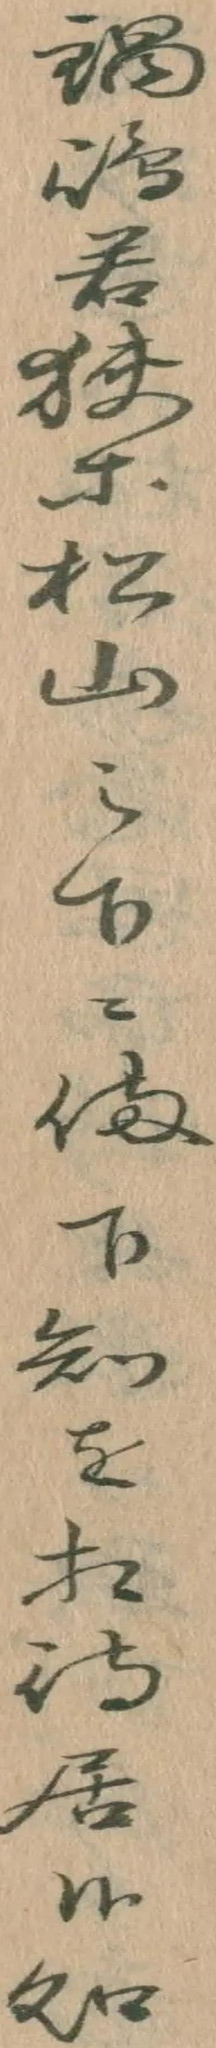鍋島若狭等松山之下に備下知を相待居候処
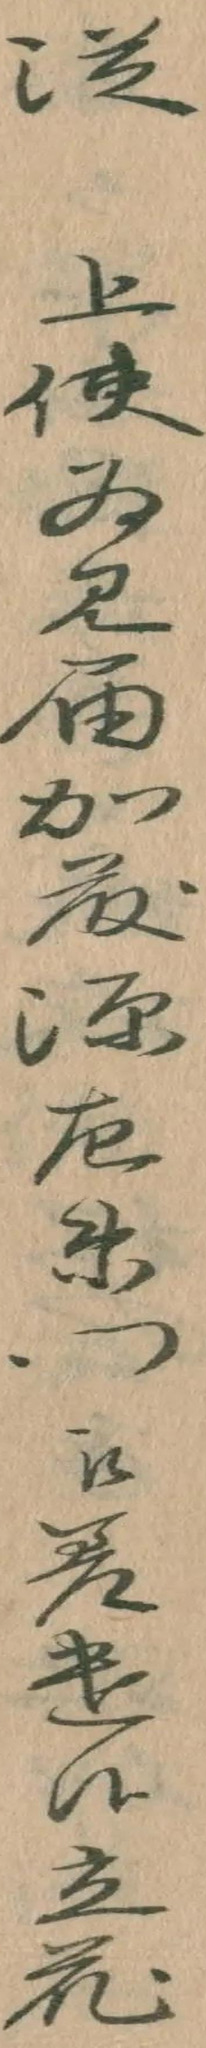従上使ゐ見届加藤源左衛門被差遣候立花
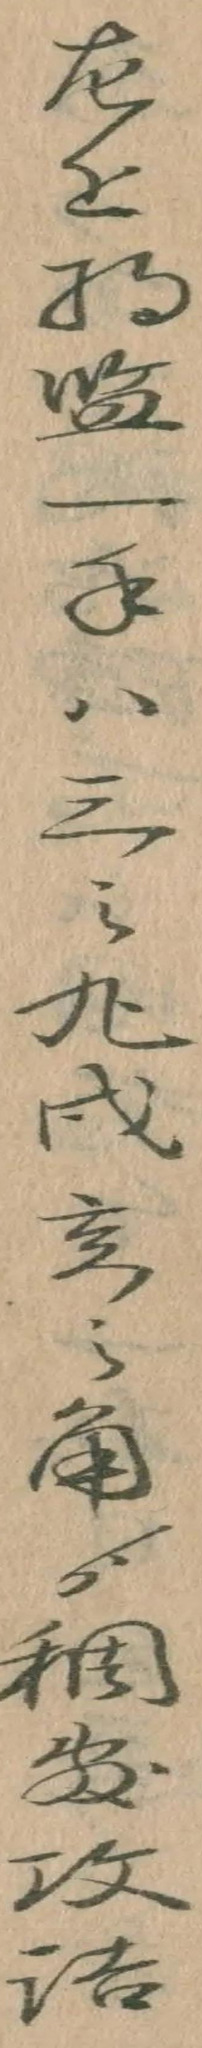左近将監一手は三之丸戌亥之角ゟ稠敷攻詰
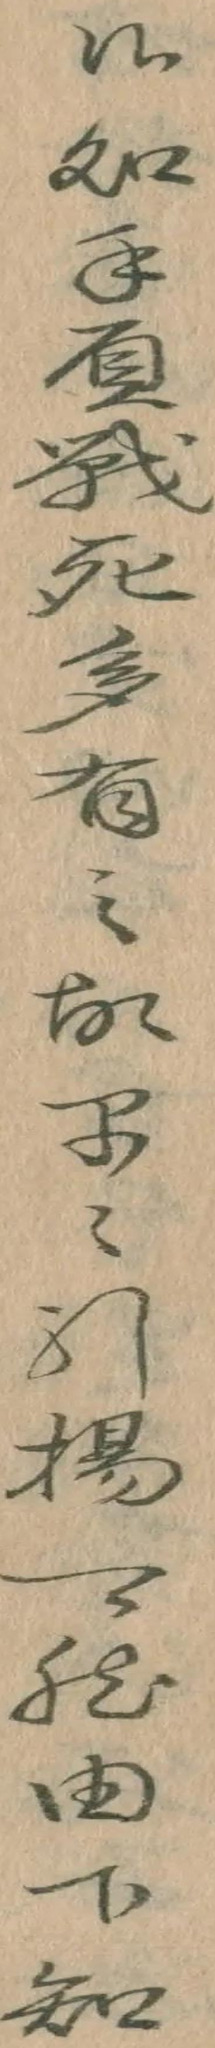候処手負戦死多有之故早々引揚可然由下知
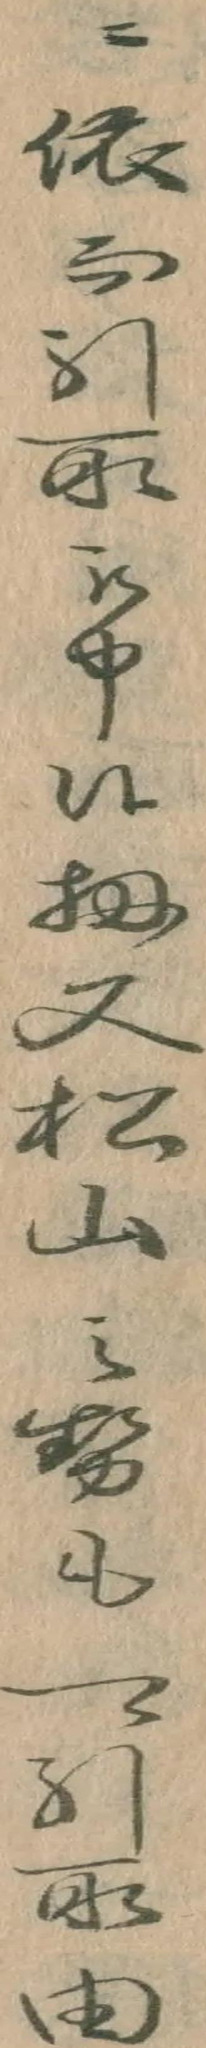に依而引取被申候扨又松山之勢も可引取由
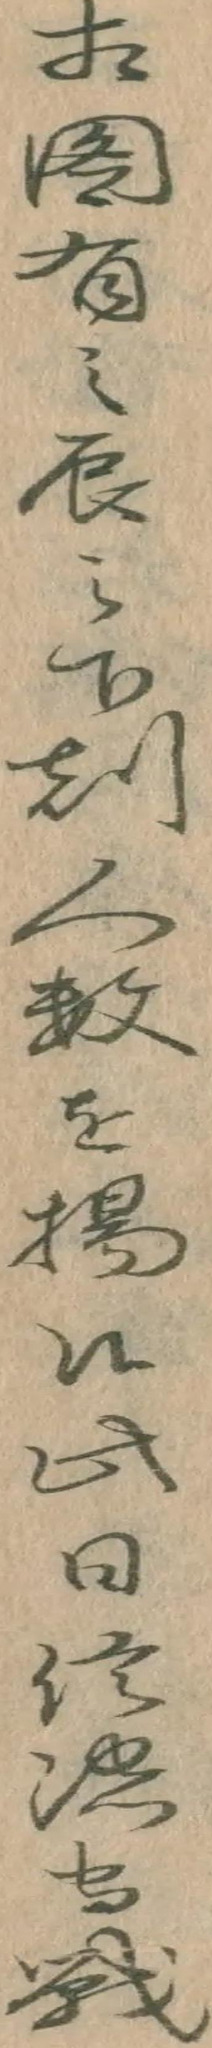相図有之辰之下刻人数を揚候此日信濃守戦
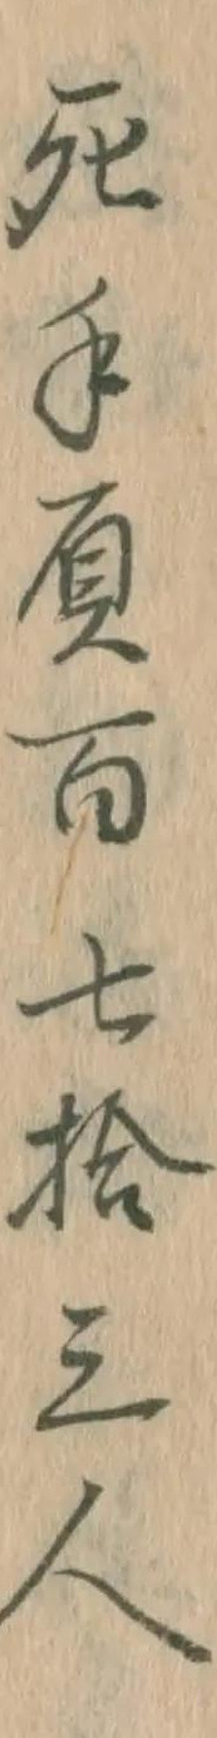死手負百七拾三人
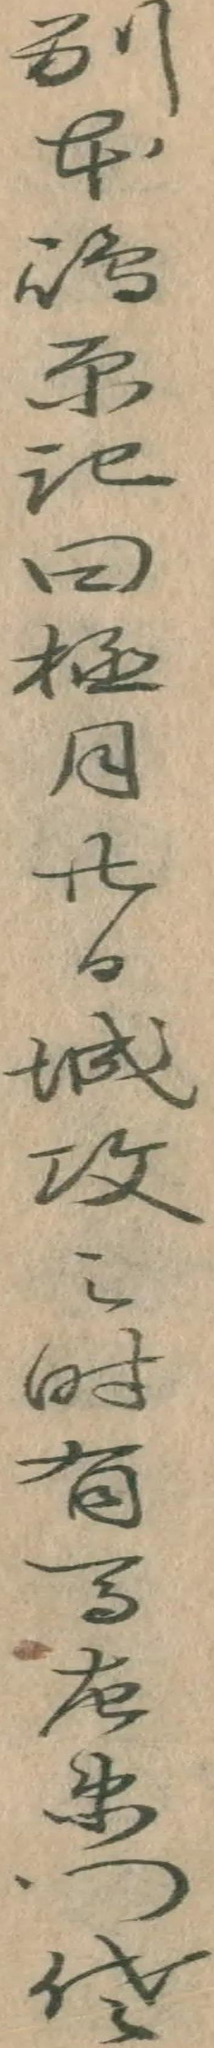別本島原記曰極月廿日城攻之時有馬左衛門佐
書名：切支丹御退治記 49巻. [4]
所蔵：国立国会図書館 National Diet Library, JAPAN
